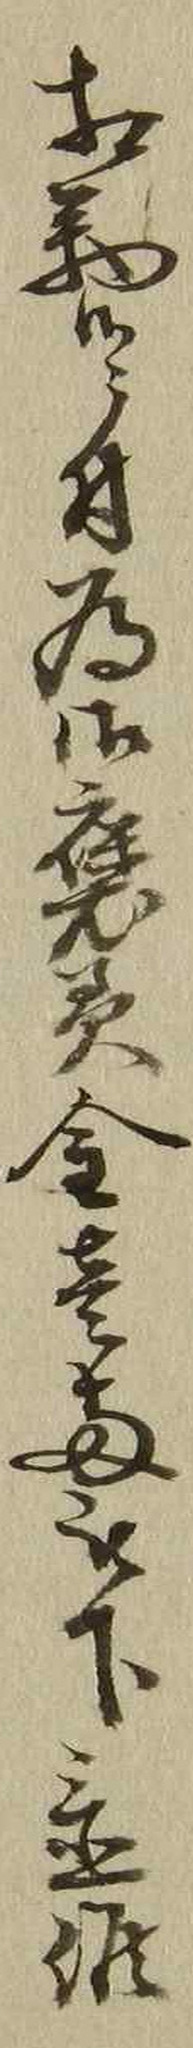相勤候ニ付為御褒美金壱両被下置候
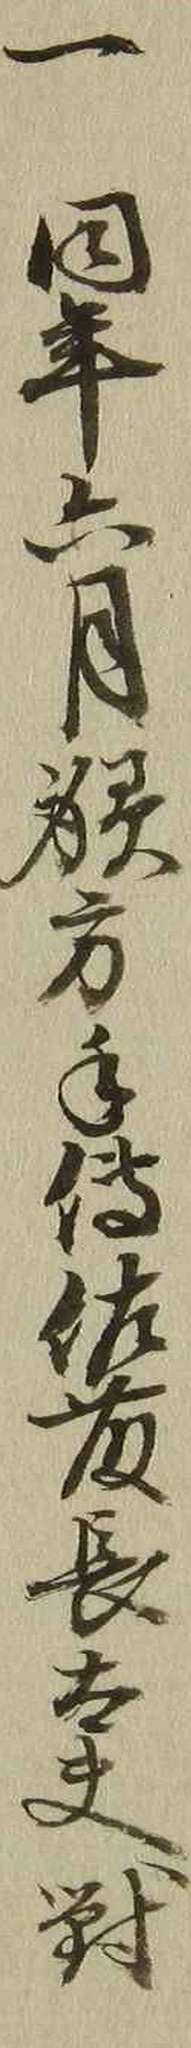一同年六月躾方手伝佐藤長太夫ヘ対
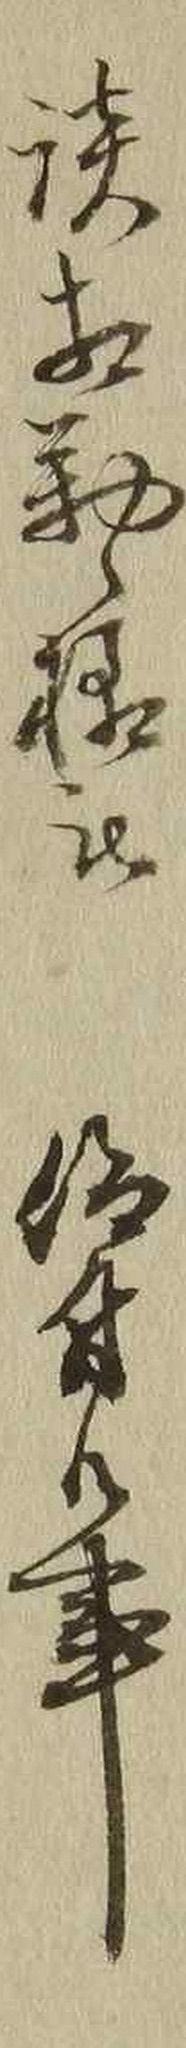談相勤候様被仰付候事
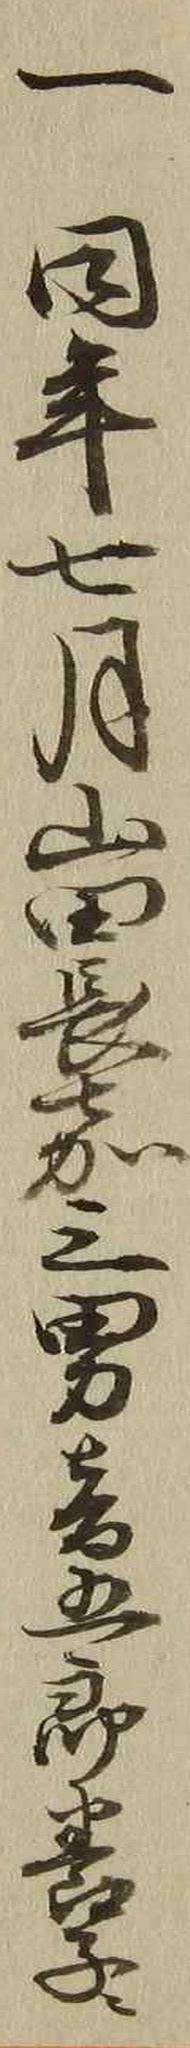一同年七月山田長嘉三男音五郎養子ニ
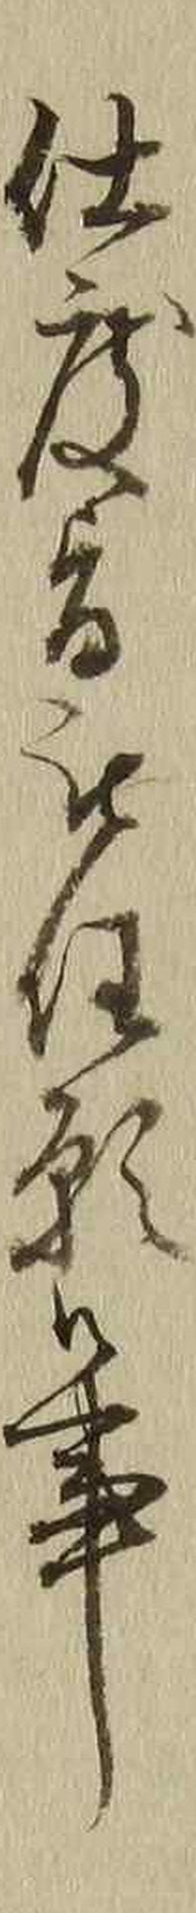仕度旨被任願候事
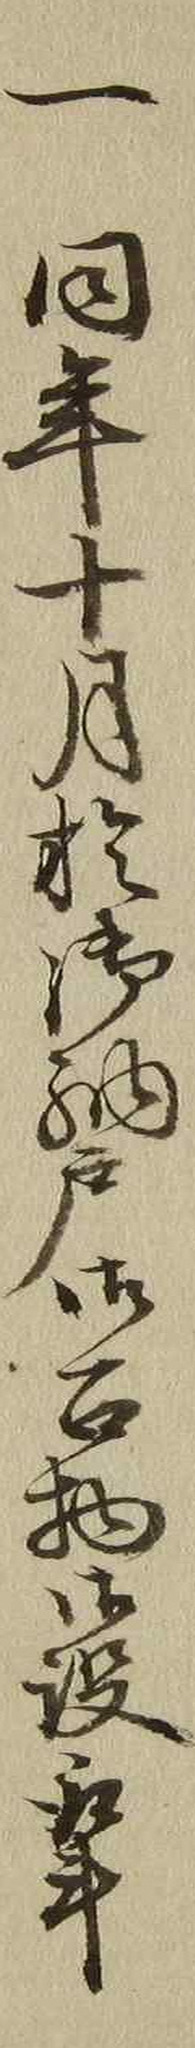一同年十月於御納戸御召物御設取斗
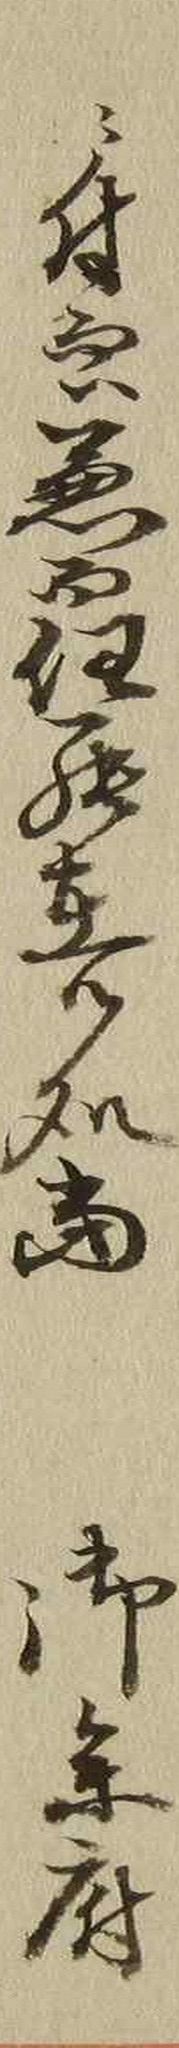ニ付而ハ兼而任罷在候処当御参府
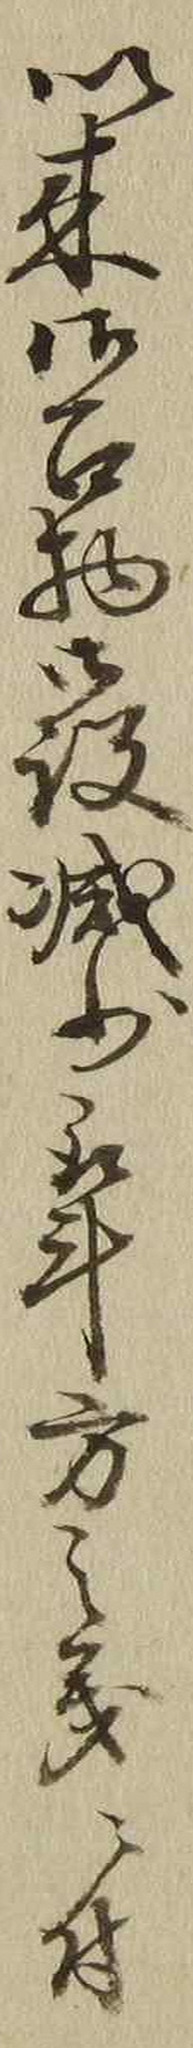以来御召物御設減少取斗方之義ニ付
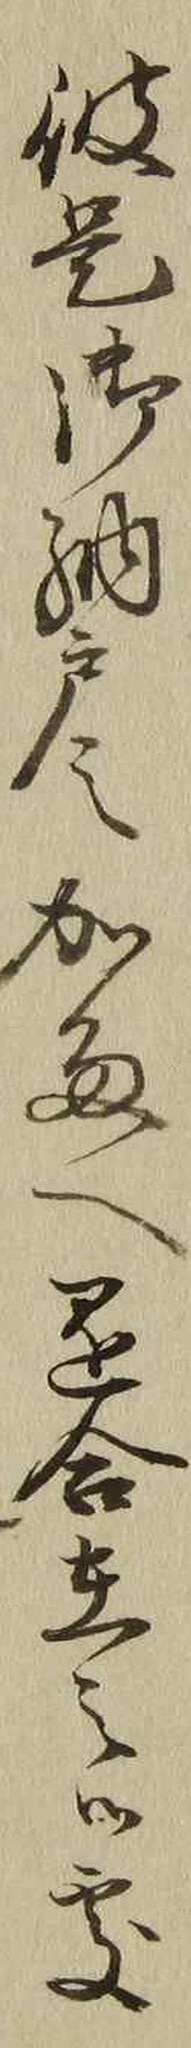彼是御納戸之かたへ懸合在之候處
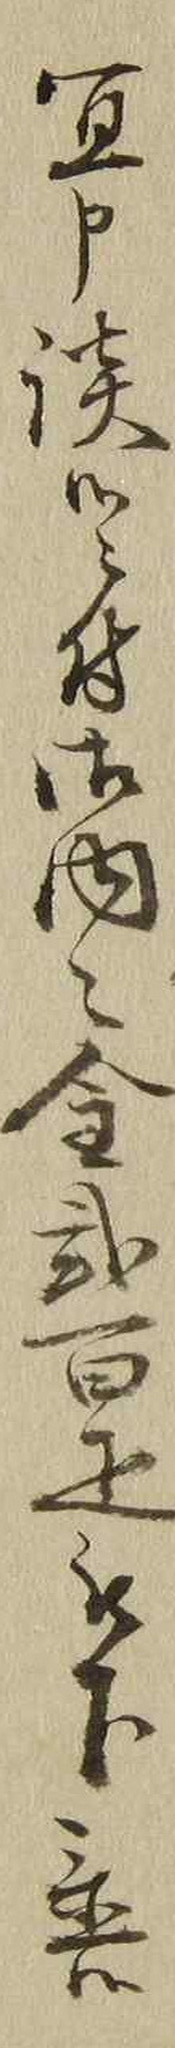宣申談候ニ付御内々金弐百疋被下置候
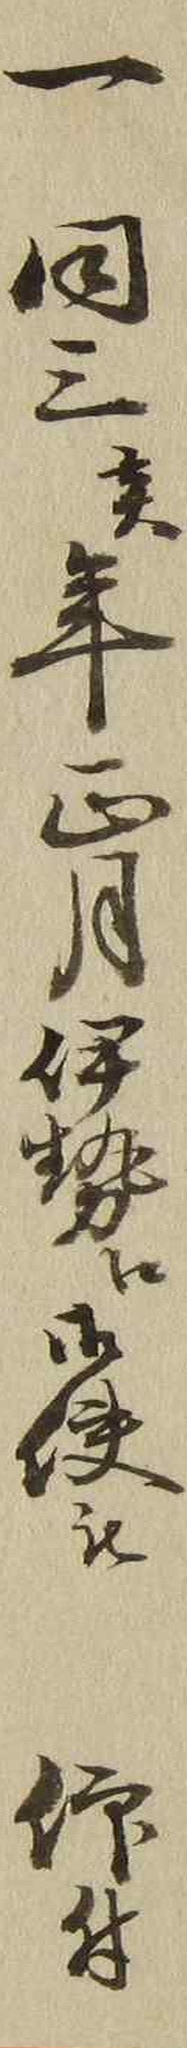一同三亥年正月伊勢江御使被仰付
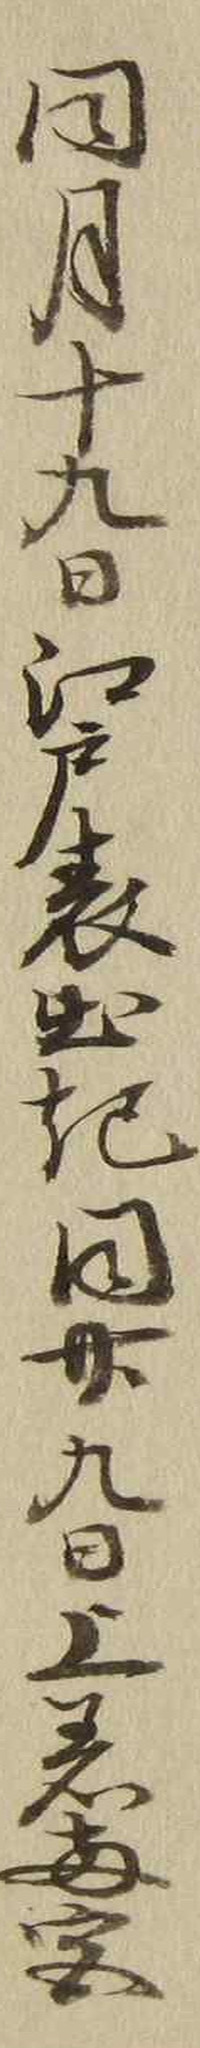同月十九日江戸表出起同廿九日上着両宮

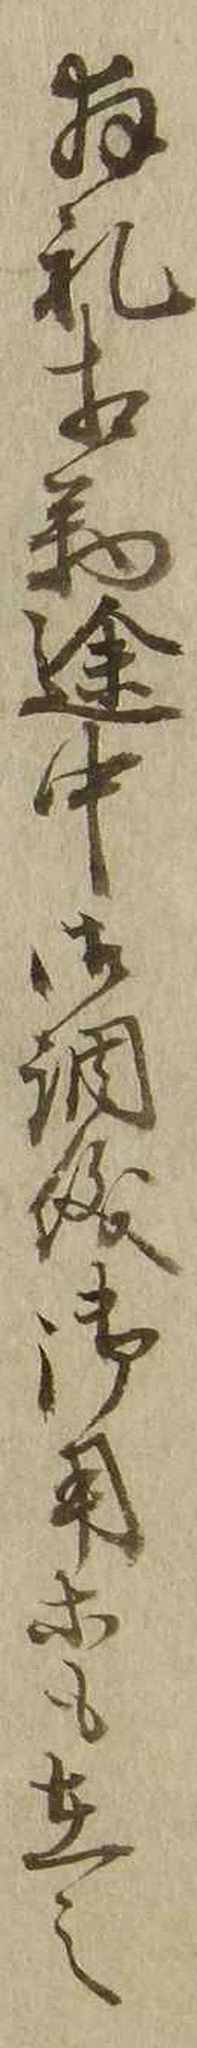拝礼相勤途中御調儀御用等も在之
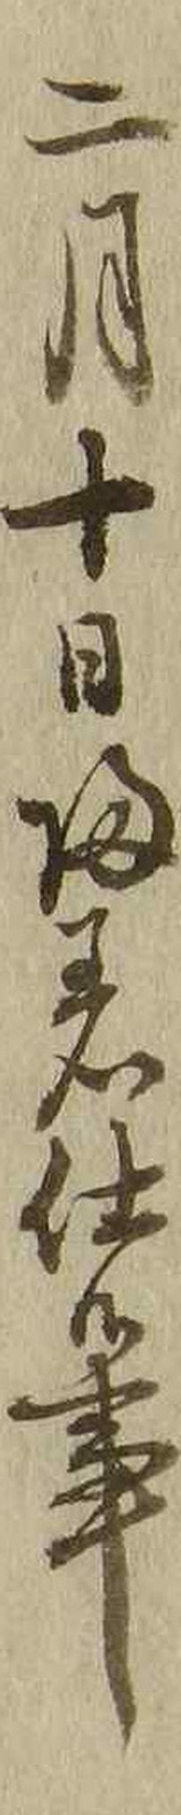二月十日帰着仕候事
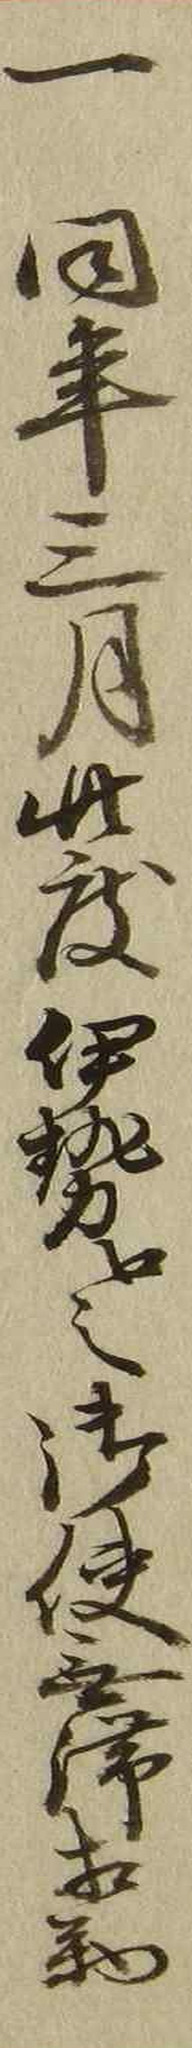一同年三月此度伊勢江之御使無滞相勤
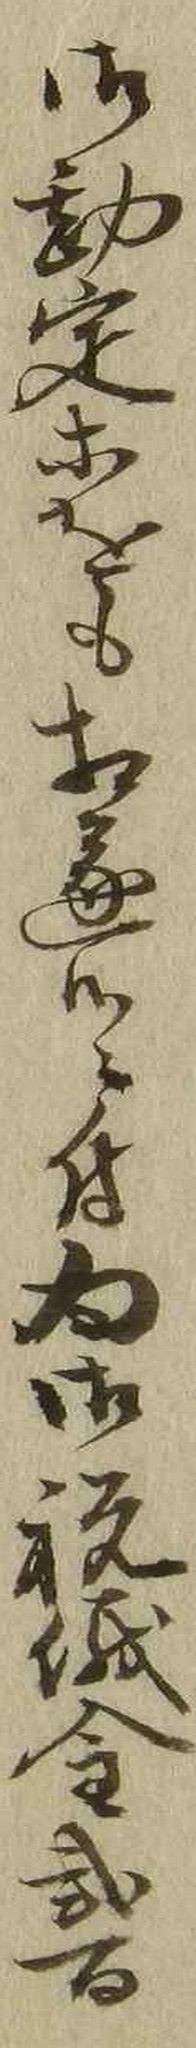御勘定等をも相遂候ニ付為御祝儀金弐百
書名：諸士系譜　巻之64　と之部7
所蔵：会津若松市立会津図書館
